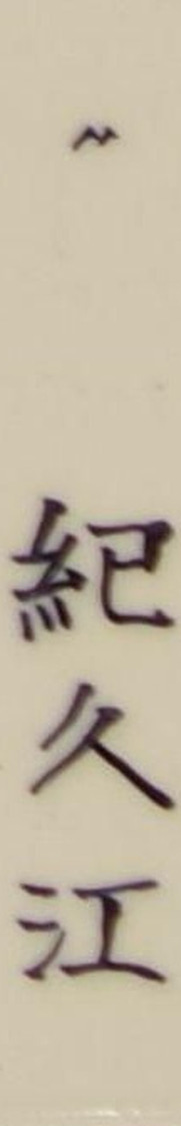紀久江
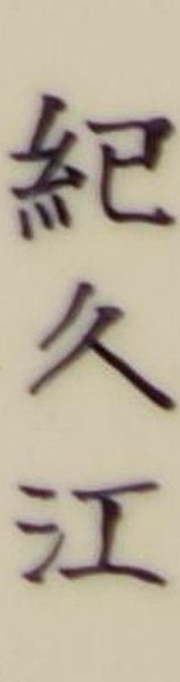紀久江
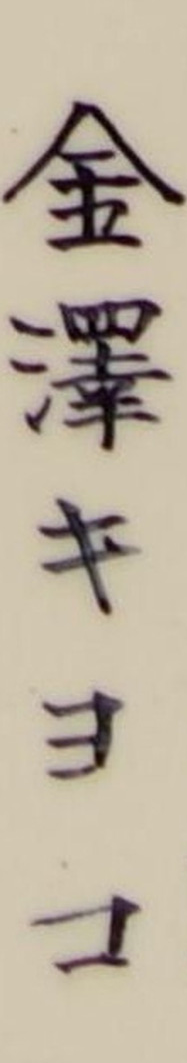金澤キヨコ
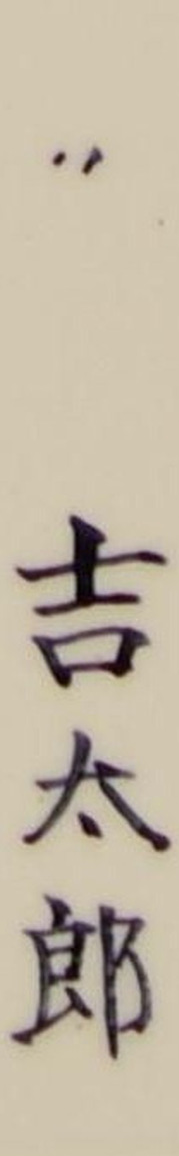吉太郎
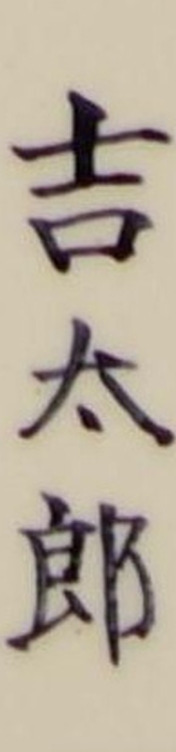吉太郎
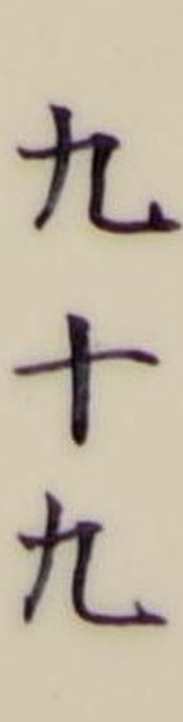九十九
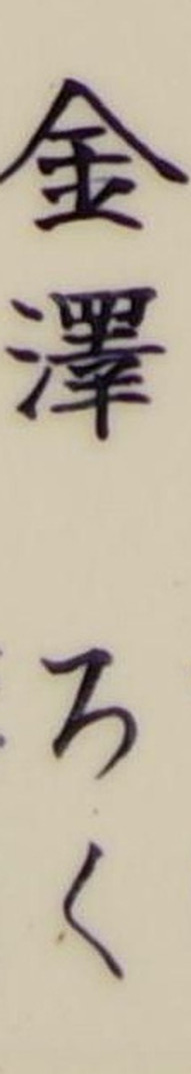金澤ろく
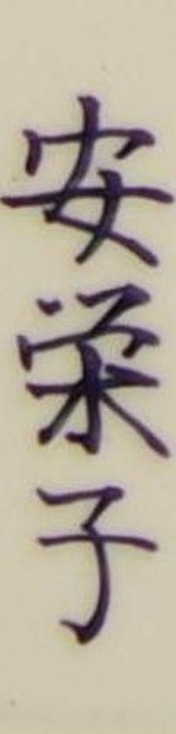安栄子
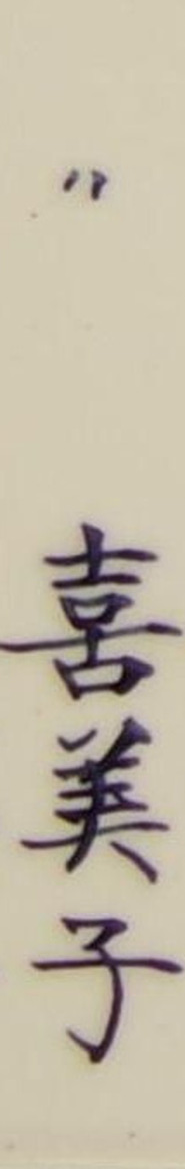喜美子
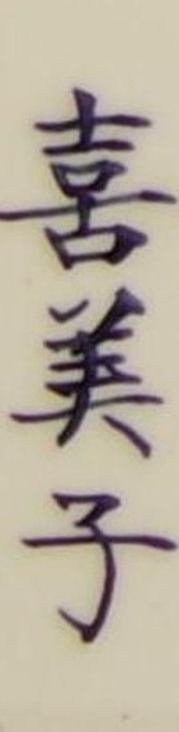喜美子

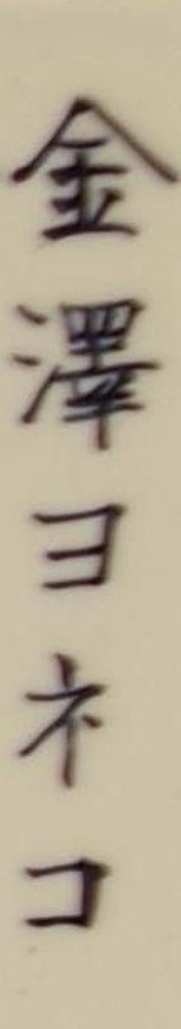金澤ヨネコ
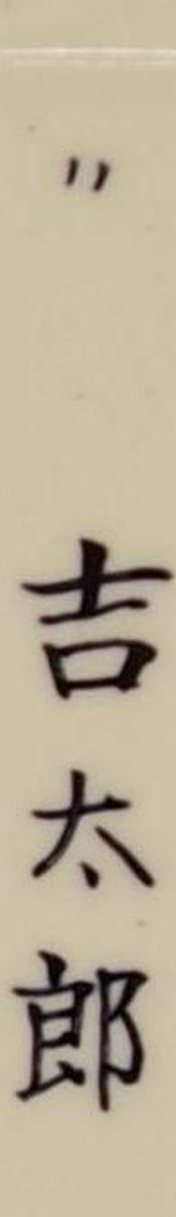吉太郎
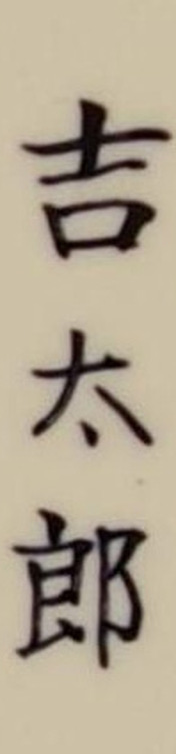吉太郎
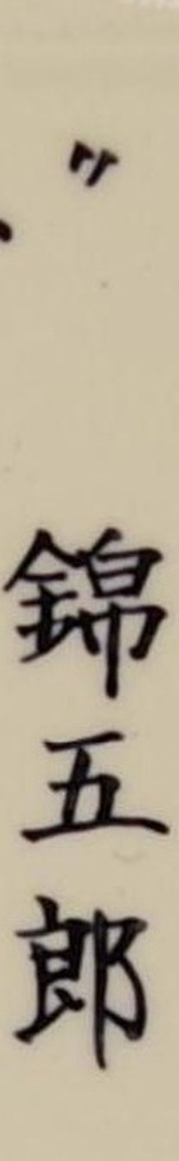錦五郎
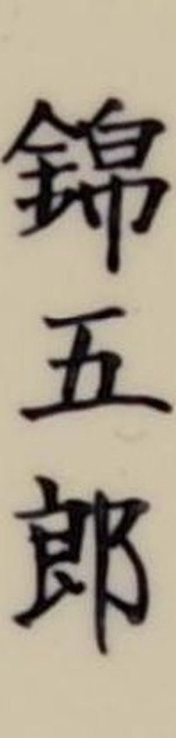錦五郎
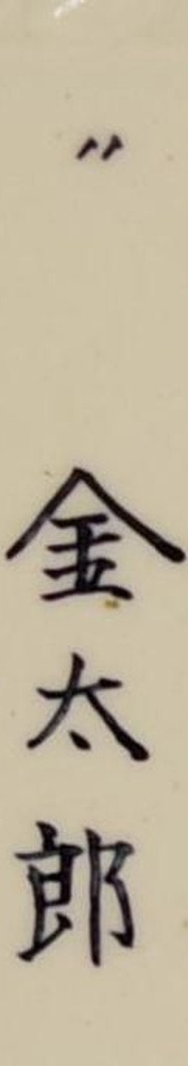金太郎
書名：A~D
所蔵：koyasan kongobuji
